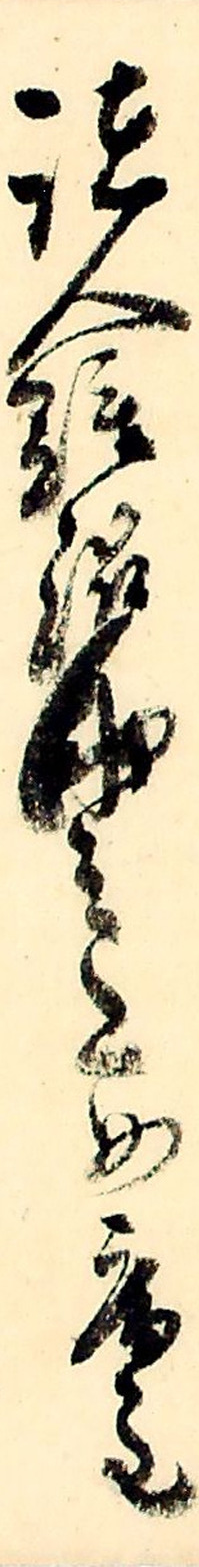諸人難渋助之ため庵主
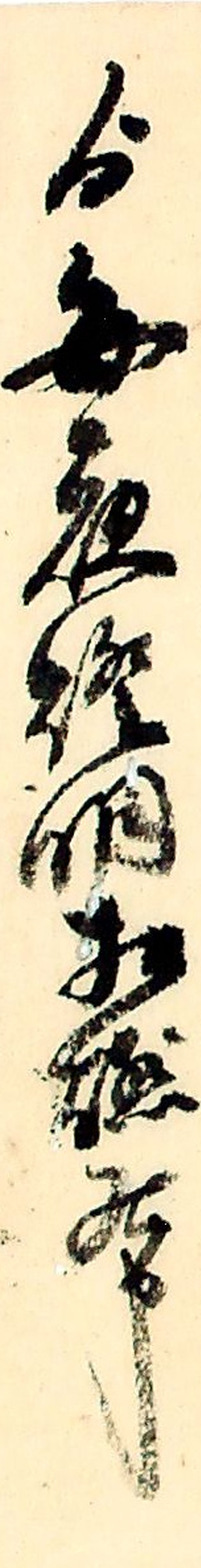ゟ毎夜灯明相燃居申
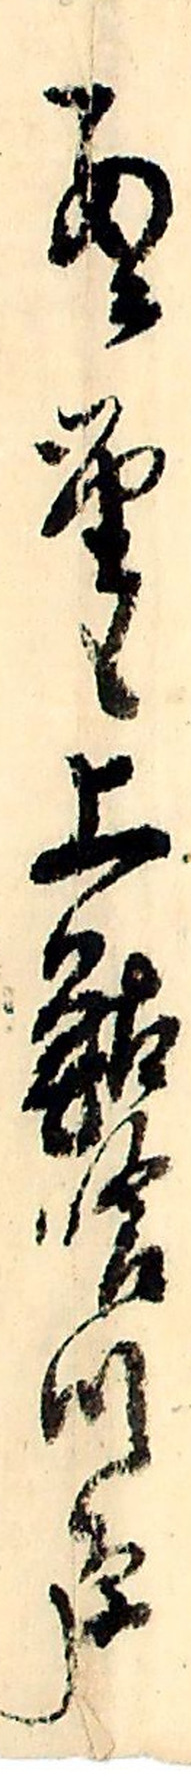段に御座候上鮎喰川原
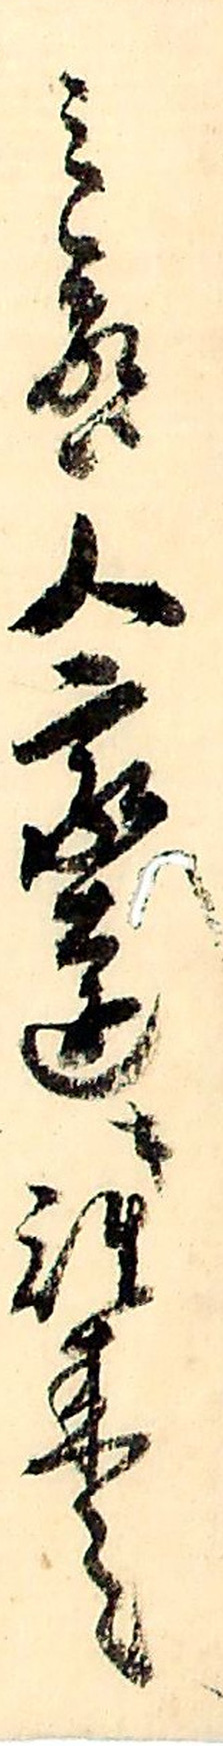之義は人家遠き往来之
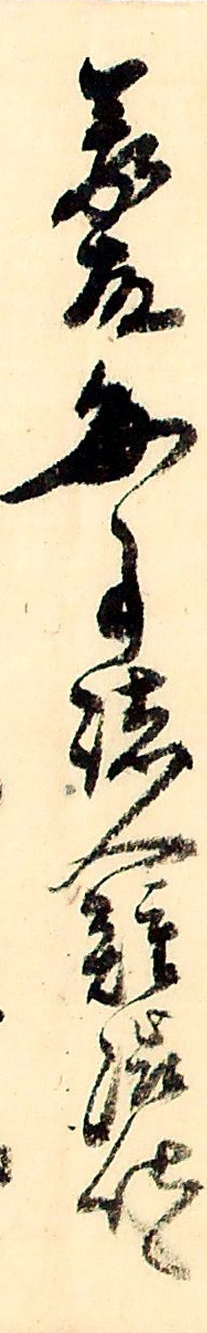義故毎事諸人難渋仕候
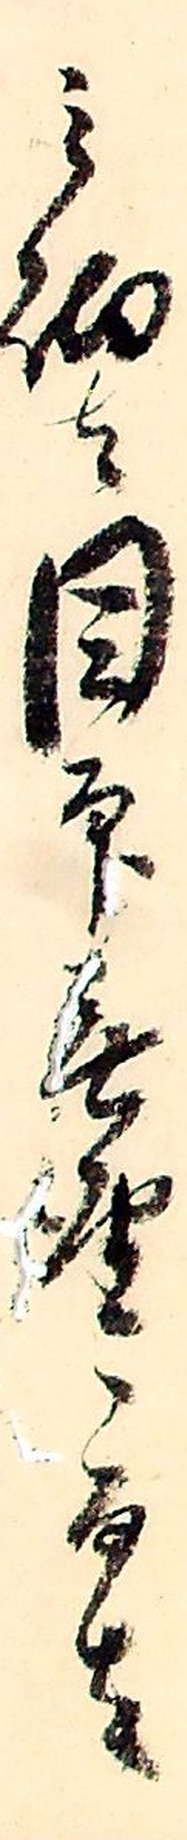之砌は目印無御座候ては

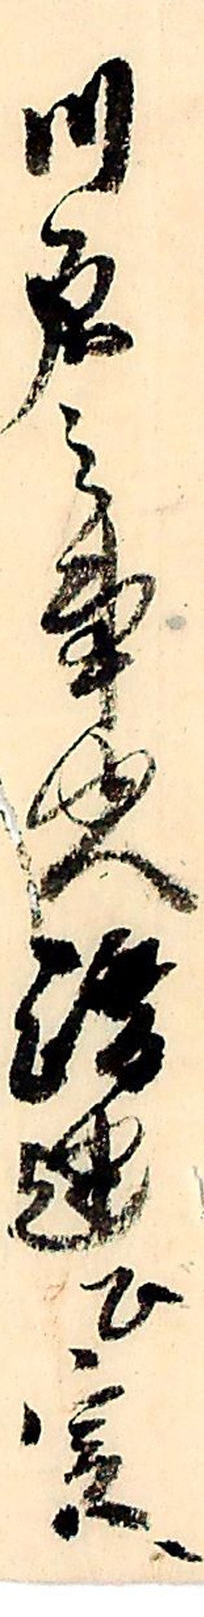川原之事ゆへ踏迷ひ実に
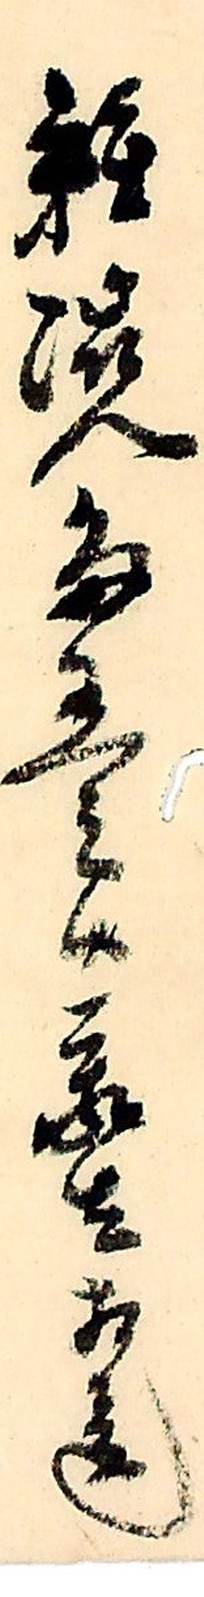難渋人多有之候義は相違
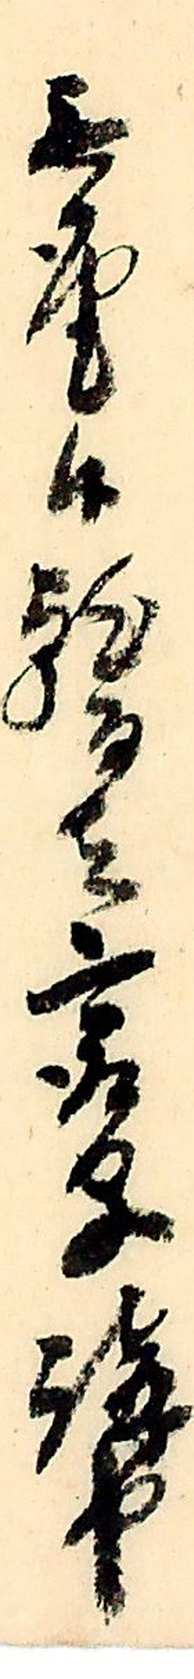無御座候就ては最早講中
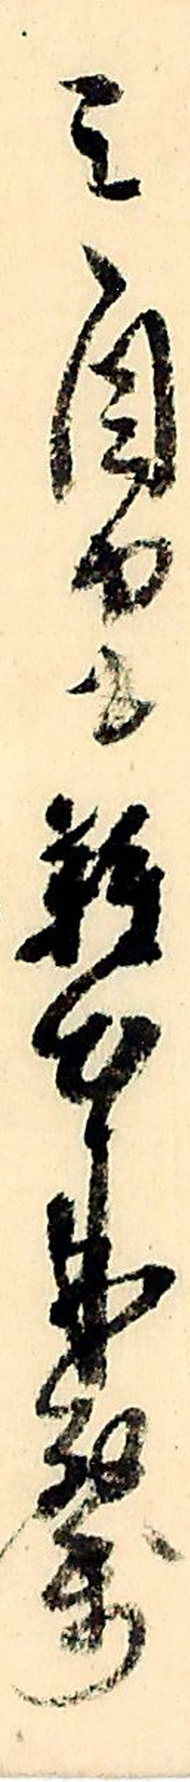之自力も難出来別紙
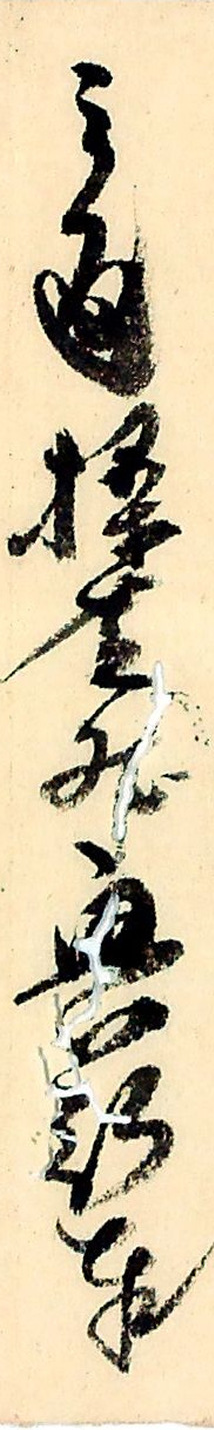之通操芝居興行奉
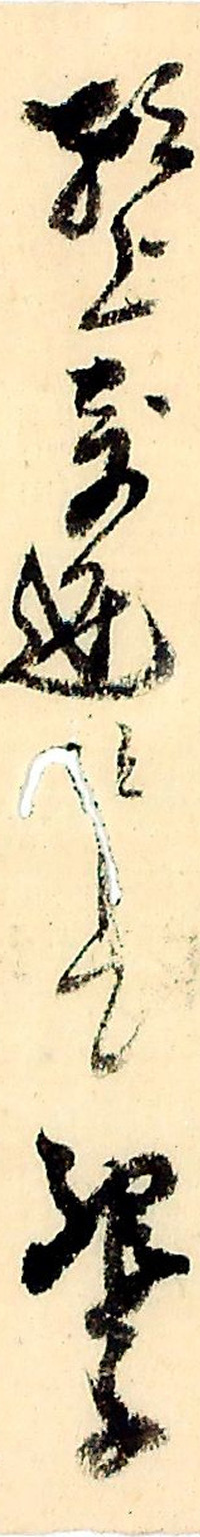願上奇進として銀子
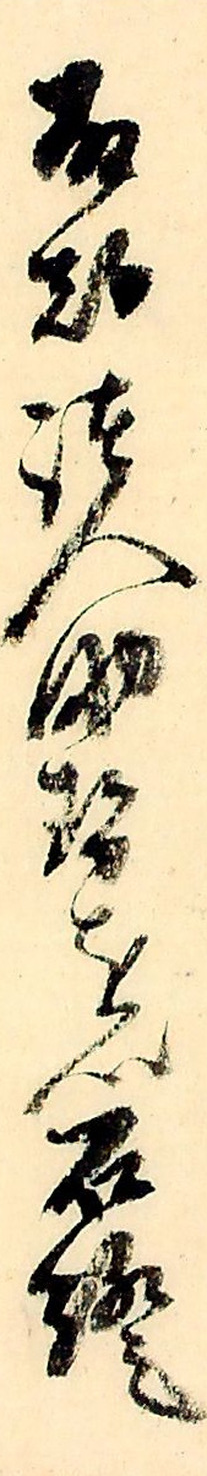取都諸人助勢を以て石灯
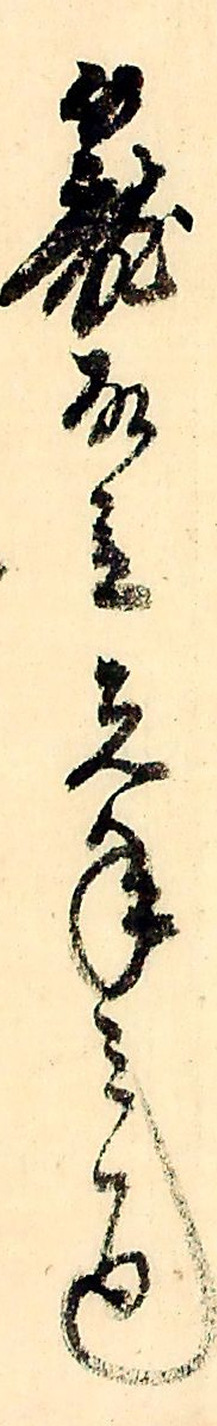籠取立先年之通
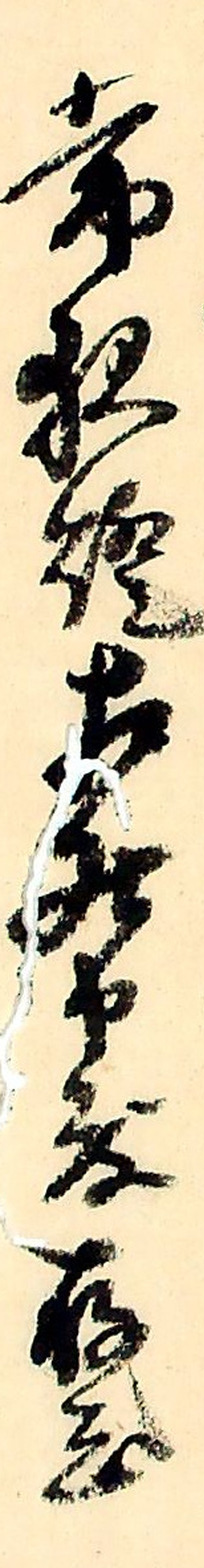常夜灯相居申度存念
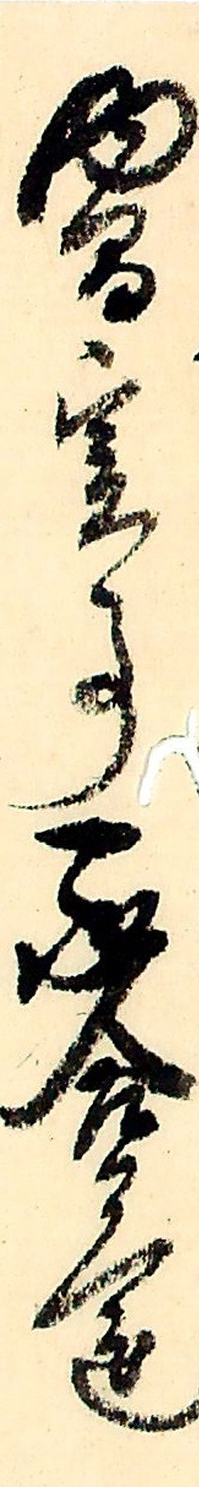内間実事承合候運
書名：和田村操芝居不合書控
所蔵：鳴門教育大学 Naruto University of Education
